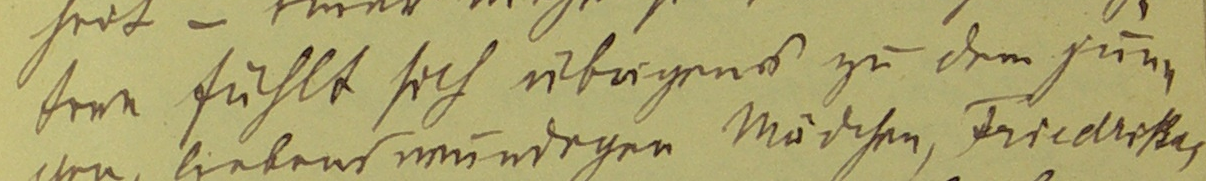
tere fühlt sich übrigens zu dem jun¬
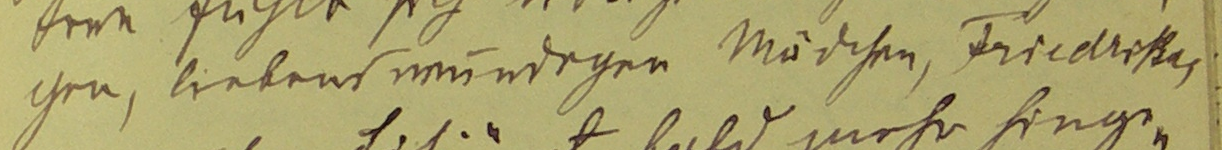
gen , liebenswürdigen Mädchen Friederike,
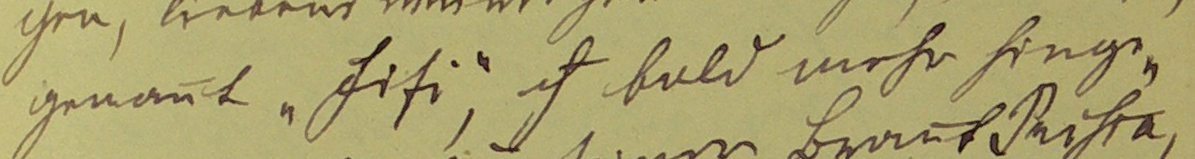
genannt „Fifi“ auch bald mehr hinge¬
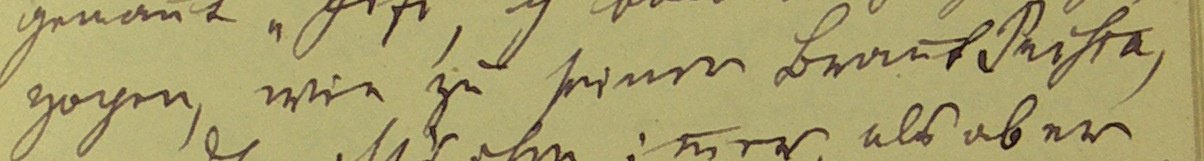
zogen, wie zu seiner Braut Riha
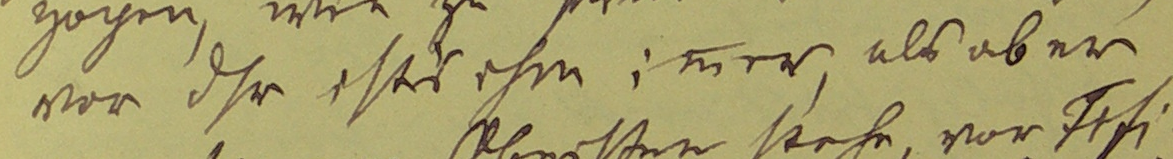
vor dieser ist´s ihm immer, als ob er
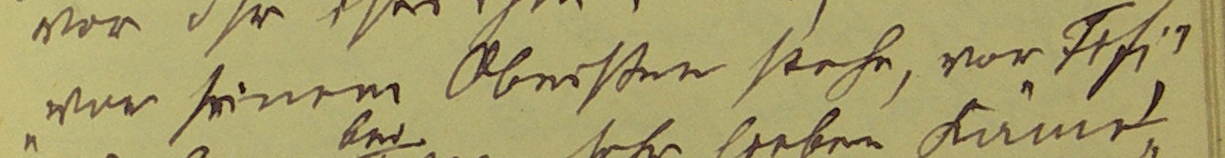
vor seinem Obristen steht , vor „Fifi“
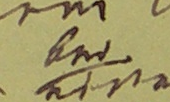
bei
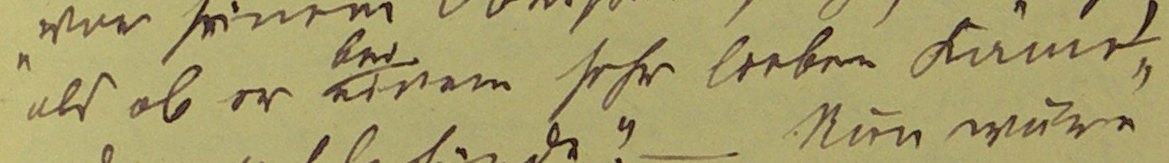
als ob er einem sehr lieben Kame¬
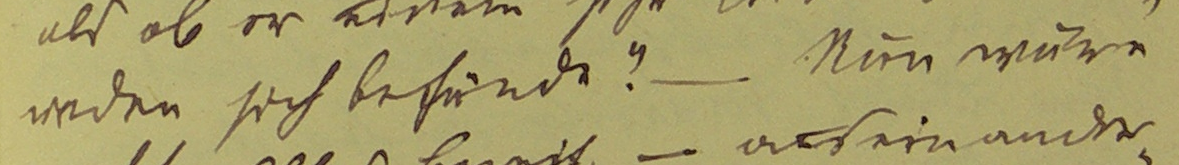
raden sich befinde,- Nun wäre also
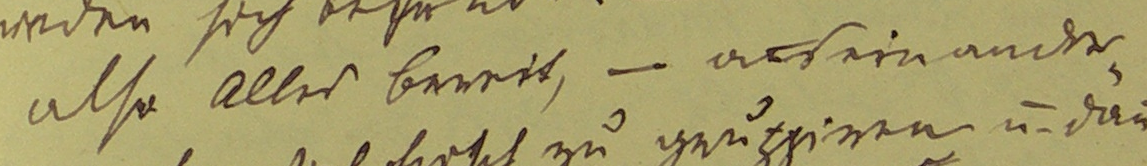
alles bereit,- auseinander¬
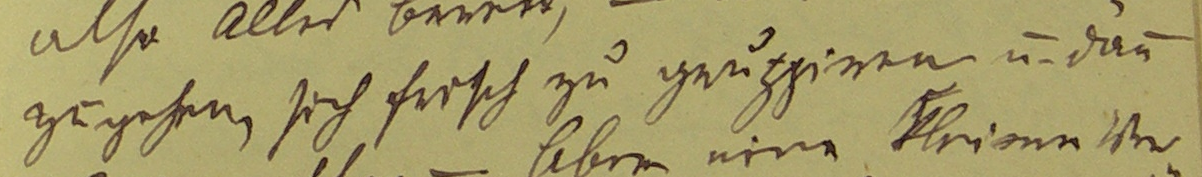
zugehen, sich frisch zu gruppieren und dann
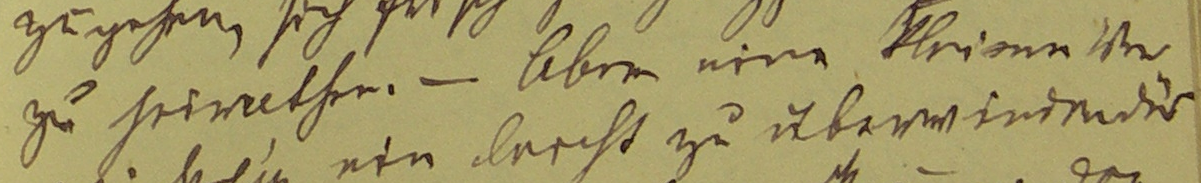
zu heiraten.- Aber eine kleine Ver¬
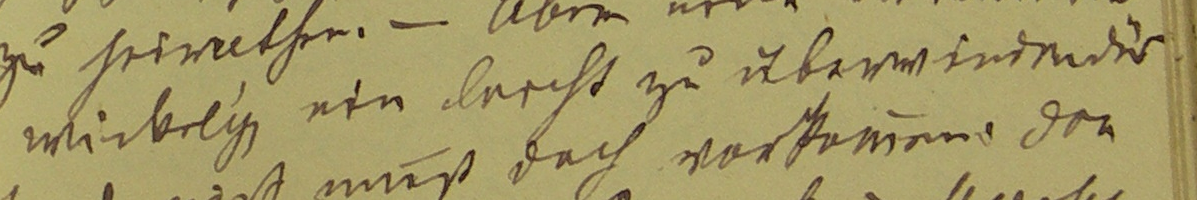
wickung ein leicht zu überwindendes
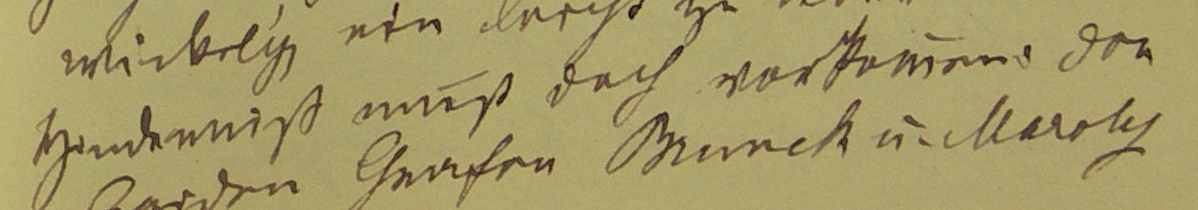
Hindernis muß doch vorkommen. Die
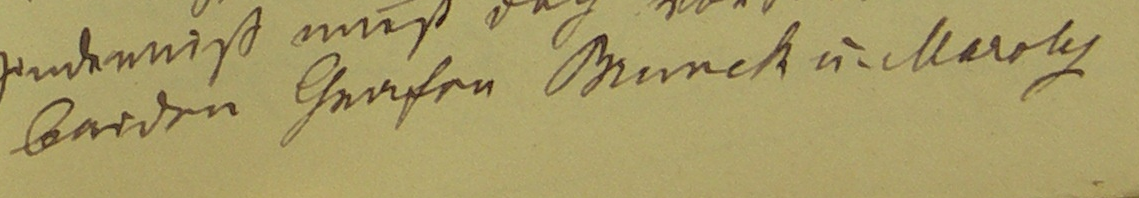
beiden Grafen Bruneck und Marloy
